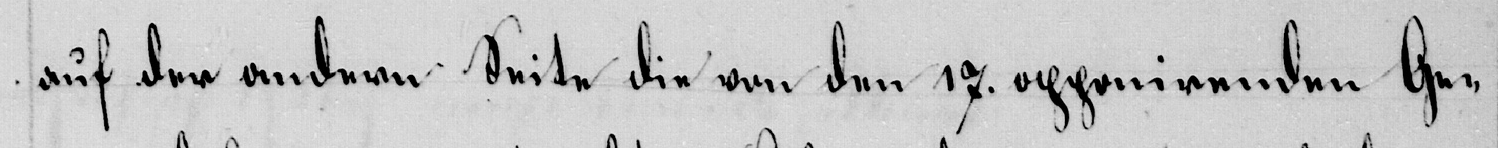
auf der andern Seite die von den 17. opponirenden Ge¬
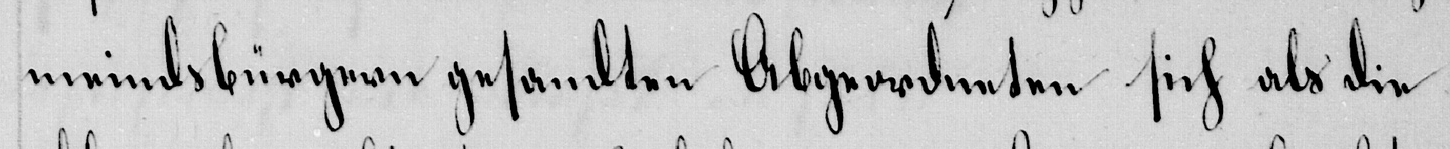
meindsbürgern gesandten Abgeordneten sich als die
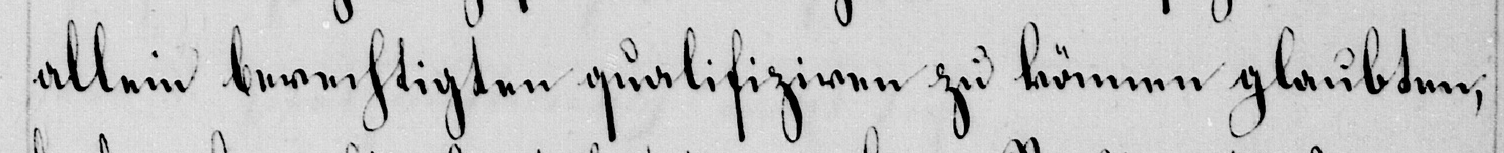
allein berechtigten qualifiziren zu können glaubten,
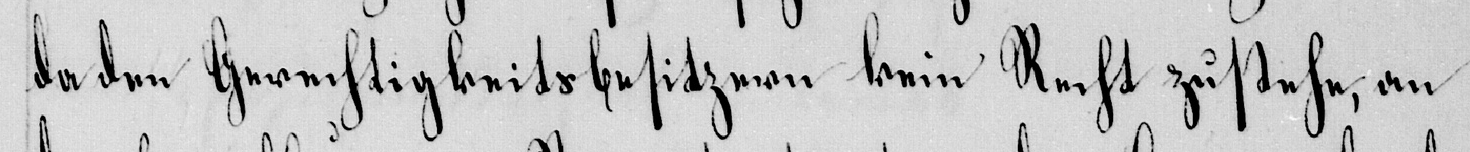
da den Gerechtigkeitsbesitzern kein Recht zustehe, an
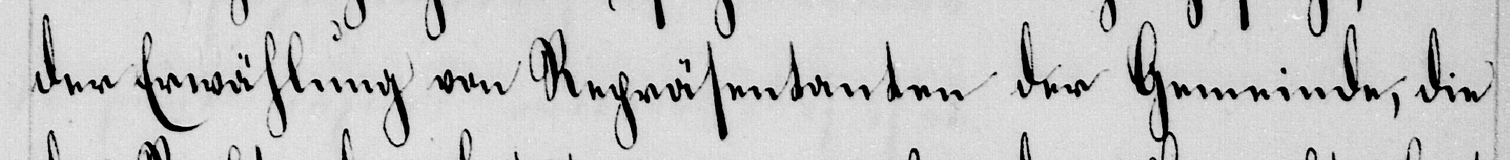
der Erwählung von Repräsentanten der Gemeinde, die
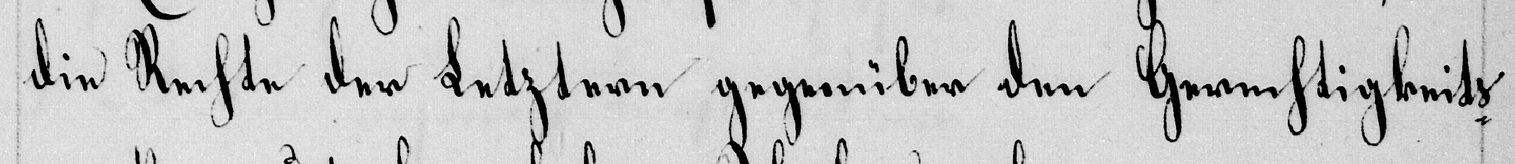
die Rechte der Letztern gegenüber den Gerechtigkeits¬
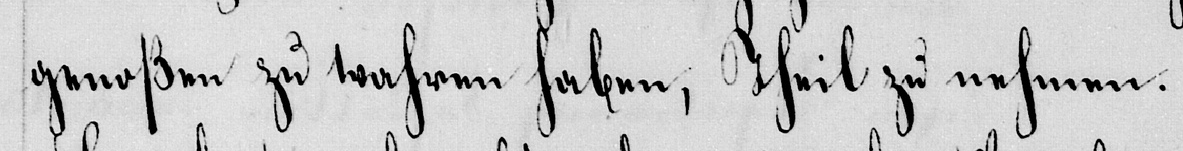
genoßen zu wahren haben, Theil zu nehmen.
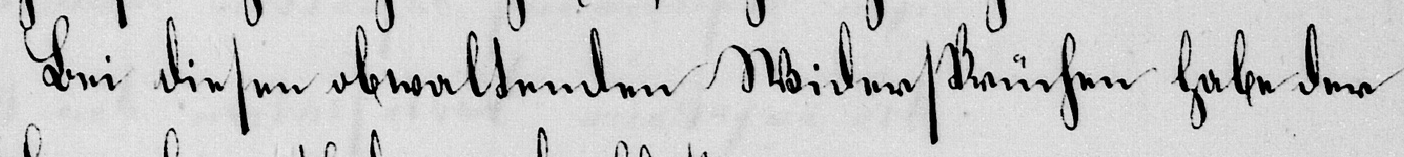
Bei diesen obwaltenden Widersprüchen habe der
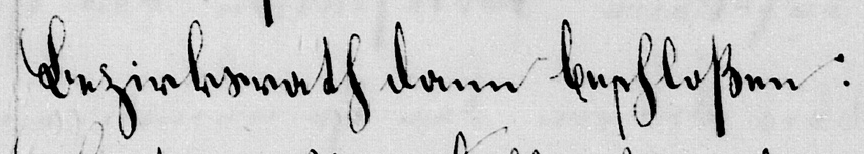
Bezirksrath dann beschloßen:
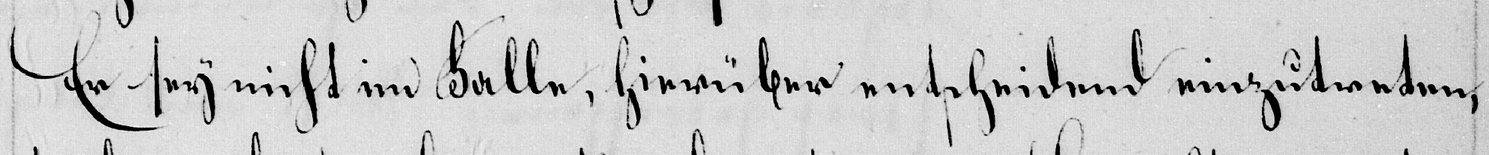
Er sey nicht im Falle, hierüber entscheidend einzutreten,
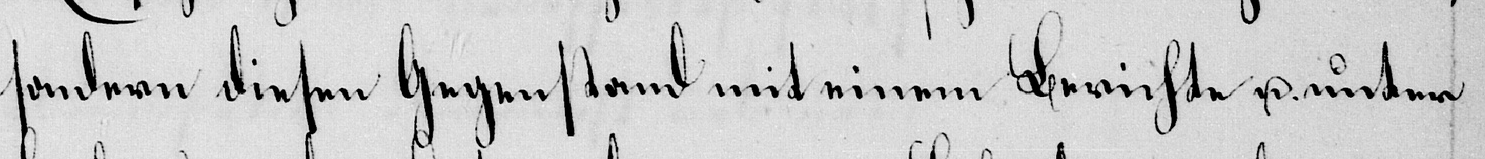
sondern diesen Gegenstand mit einem Berichte u. unter
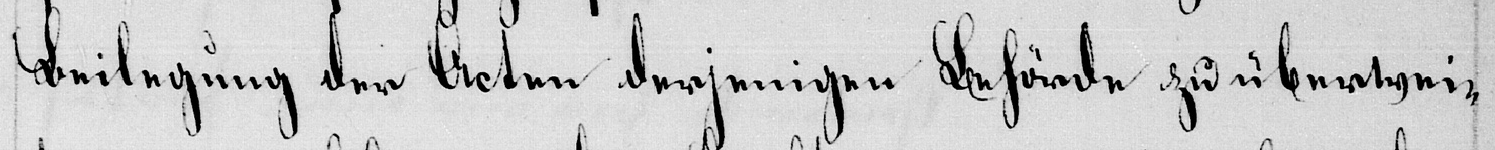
Beilegung der Acten derjenigen Behörde zu überwei¬
